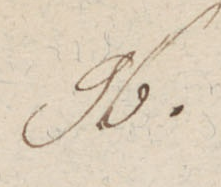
96.
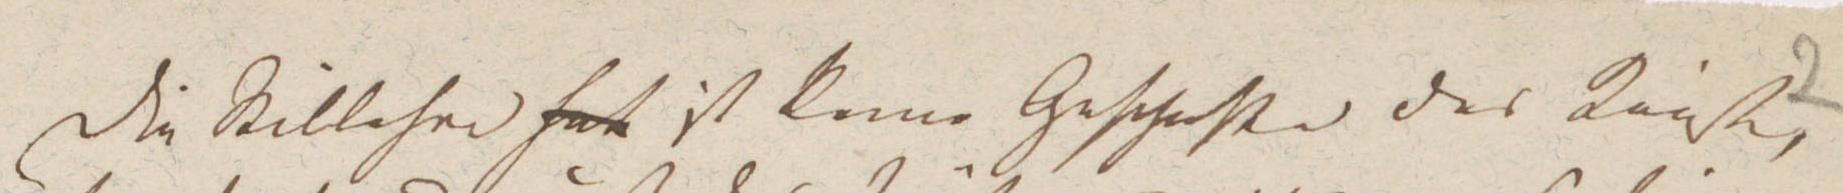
Die Stillehre hat ist keine Geschichte der Kunst,
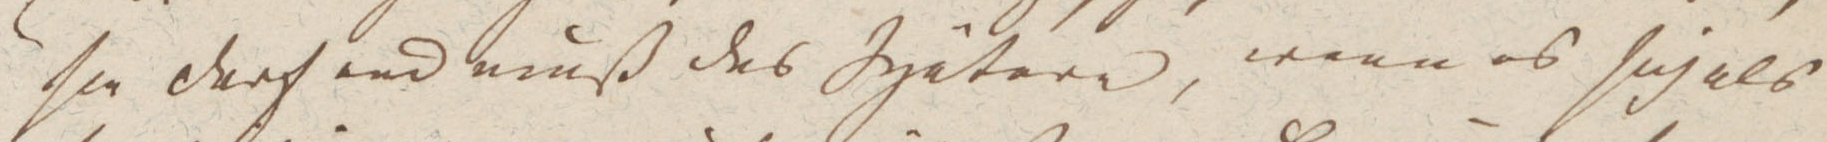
sie darf und muss das Spätere, wenn es sich als
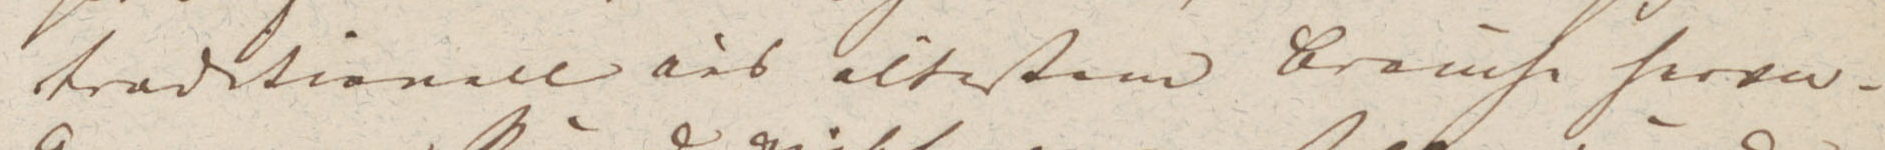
traditionell aus ältestem Brauche hervor-
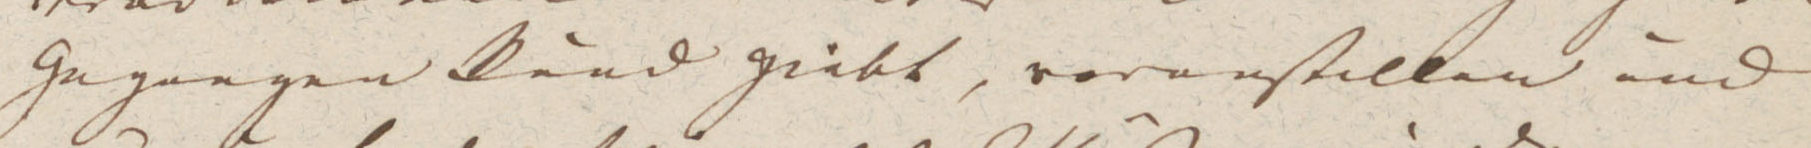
gegangen kund giebt, voranstellen und
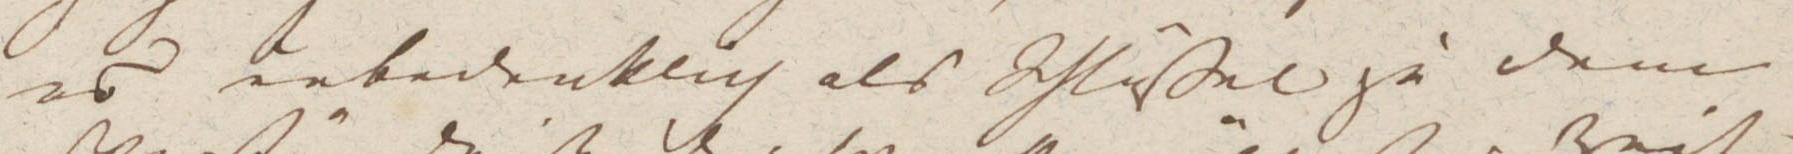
es unbedenklich als Schlüssel zu dem
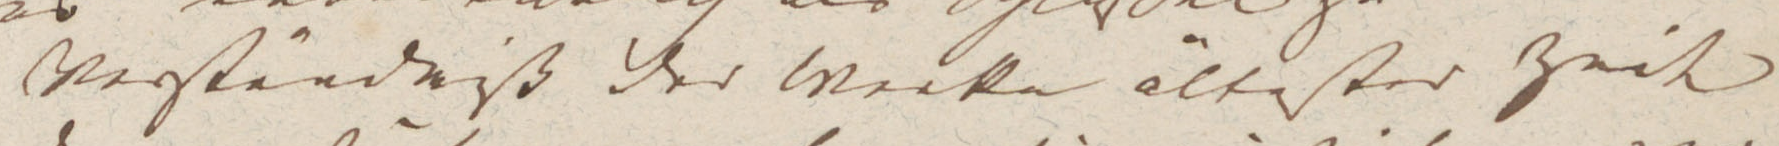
Verständniss der Werke ältester Zeit
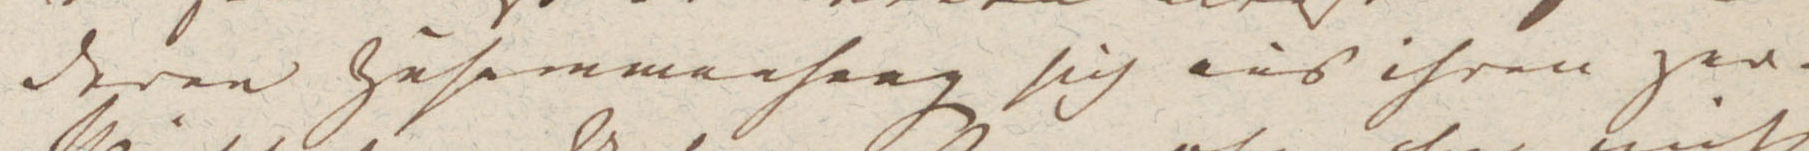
deren Zusammenhang sich aus ihren zer-
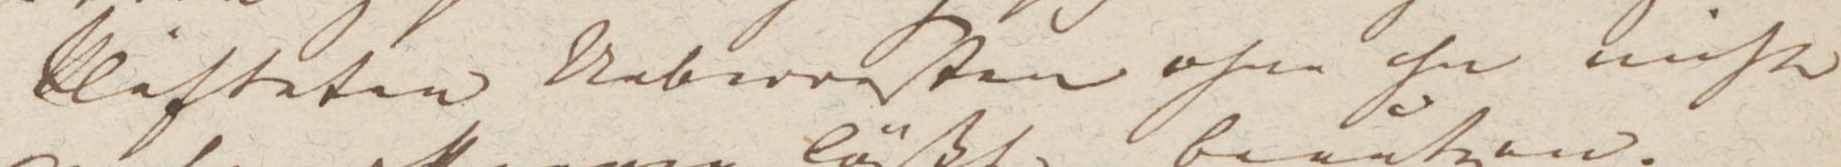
klüfteten Ueberresten ohne ihn nicht
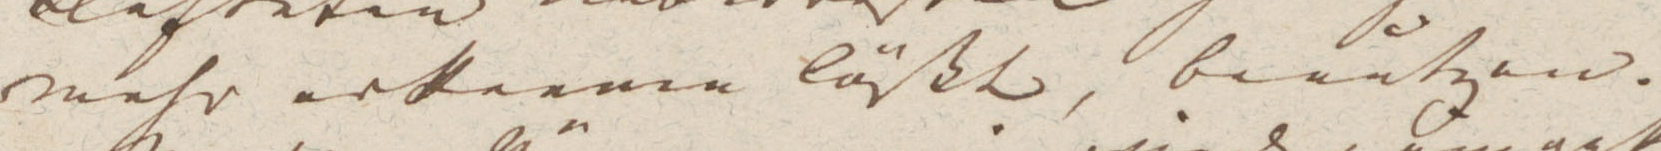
mehr erkennen lässt, benutzen.
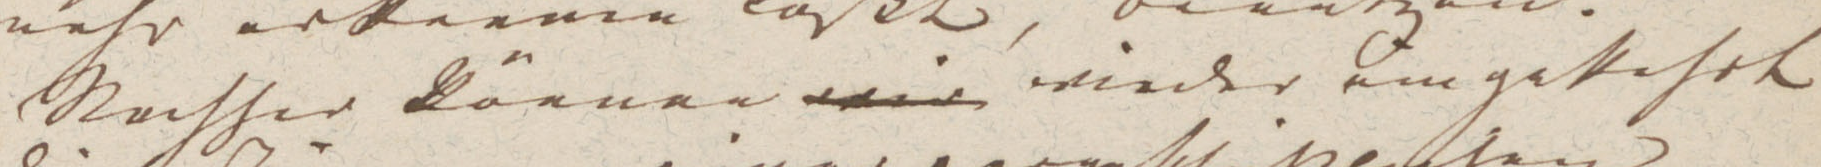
Nachher können wir wieder umgekehrt
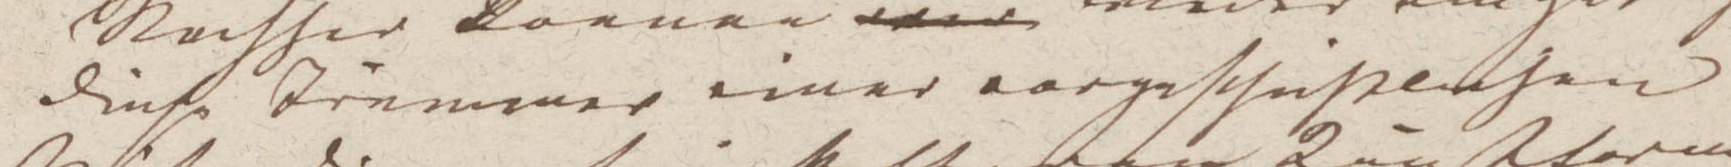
diese Trümmer einer vorgeschichtlichen
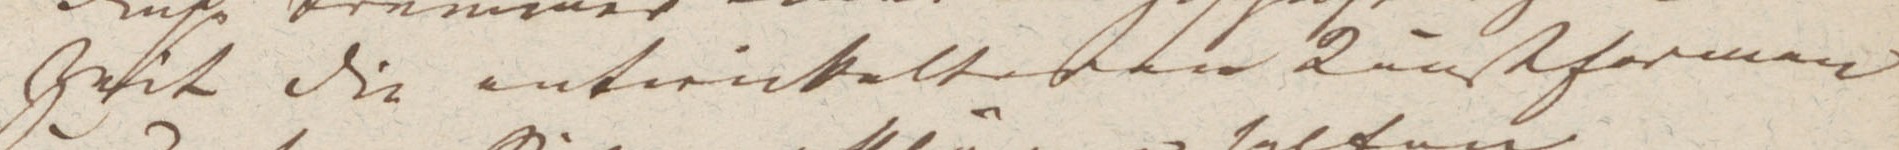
Zeit die entwickelteren Kunstformen
